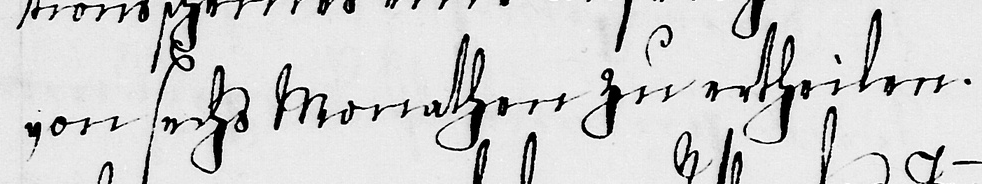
von sechs Monathen zu ertheilen.
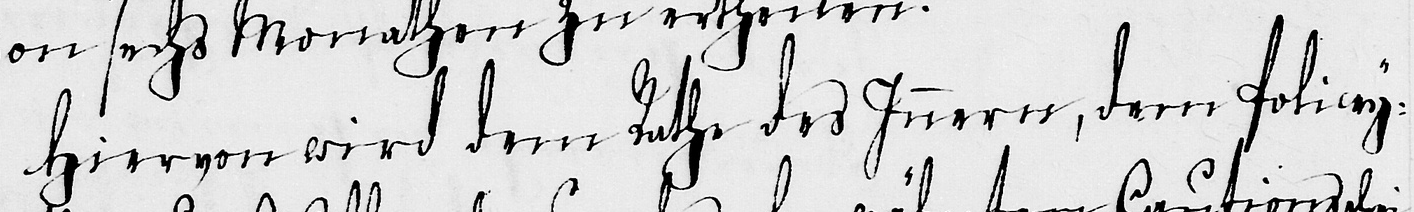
Hiervon wird dem Rathe des Innern, dem Policey¬
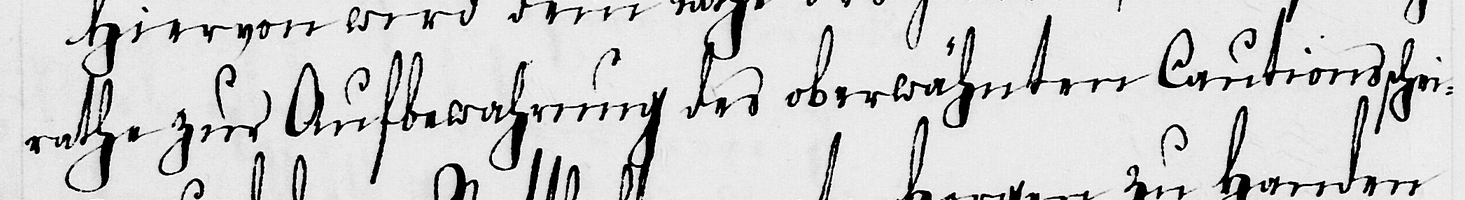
rathe zur Aufbewahrung des oberwähnten Cautionssche¬
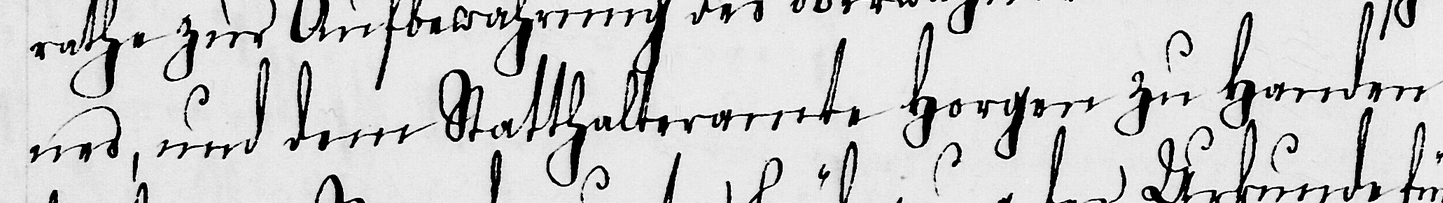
ines, und dem Statthalteramte Horgen zu Handen
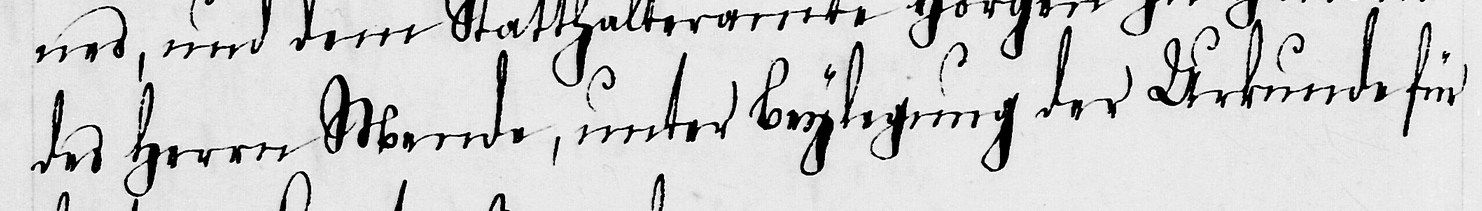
des Herrn Mende, unter Beylegung der Urkunde für
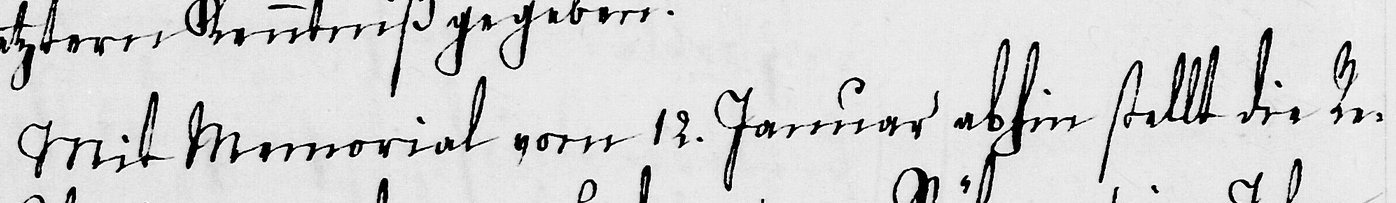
Mit Memorial vom 12. Januar abhin stellt die Re¬
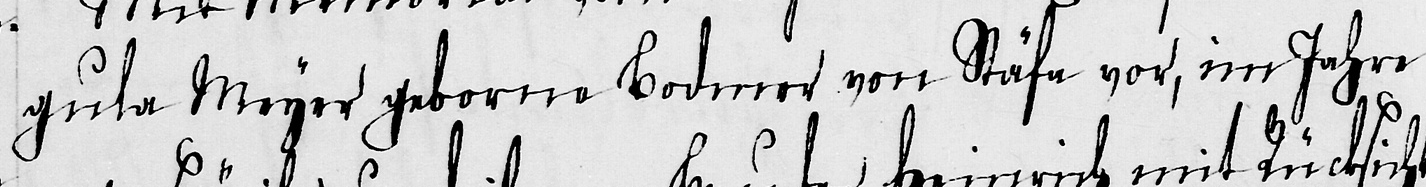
gula Meyer geborne Bodmer von Stäfa vor, im Jahre
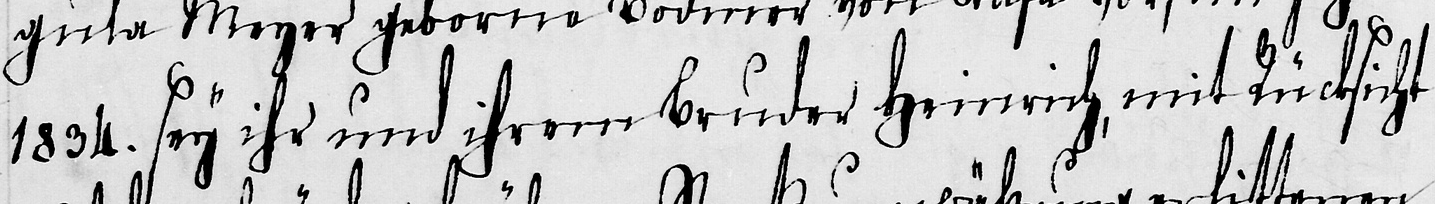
1834. sey ihr und ihrem Bruder Heinrich, mit Rücksicht
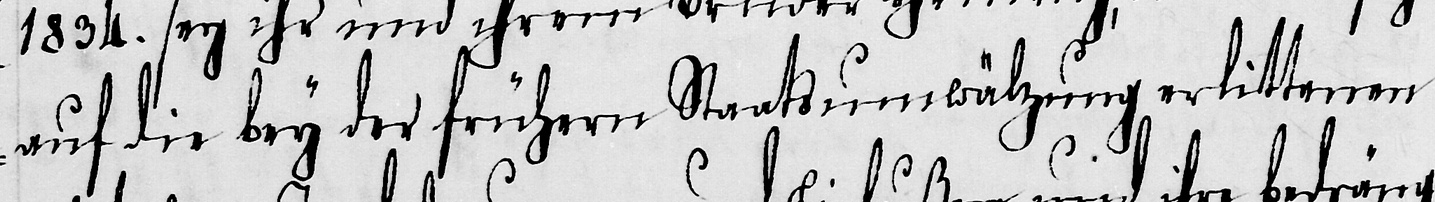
auf die bey der frühern Staatumwälzung erlittenen
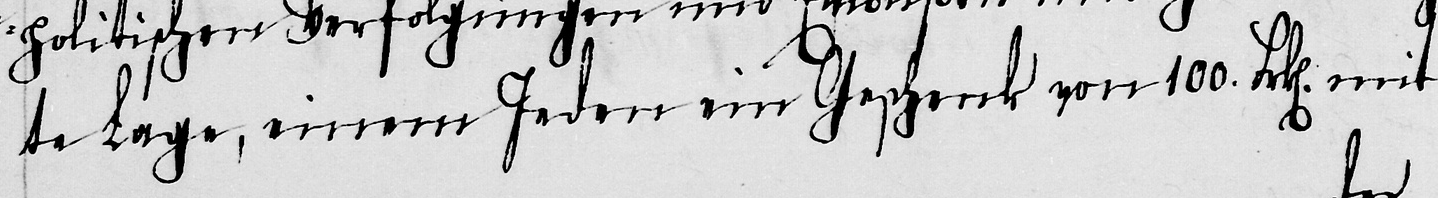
te Lage, einem Jeden ein Geschenk von 100. Frk. mit
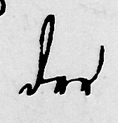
des
